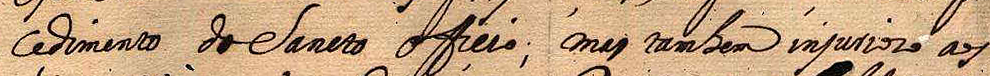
cedimento do Sancto Officio; mas tambem injuriozo aos
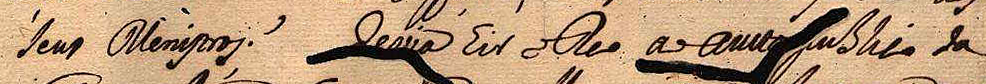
seus Menistros. devia hir o Reo ao autto publico da
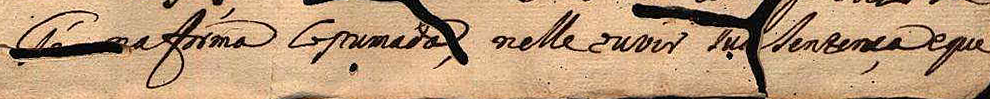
Fé na forma costumada, nelle ouvir sua sentença, e que
